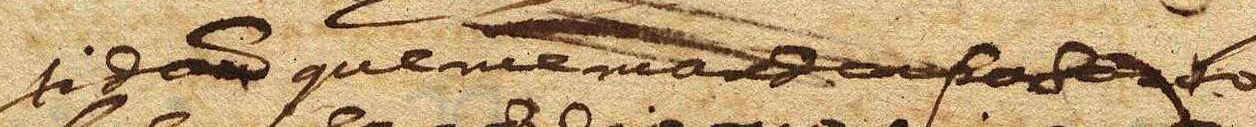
tidaõ que me mandou pasar ho
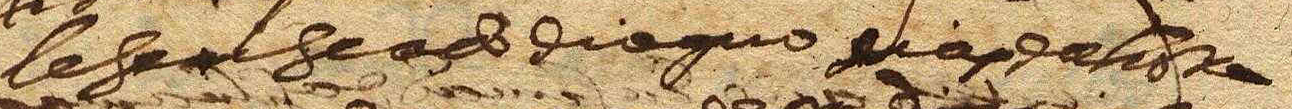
lesemseado dioguo dias da Costa
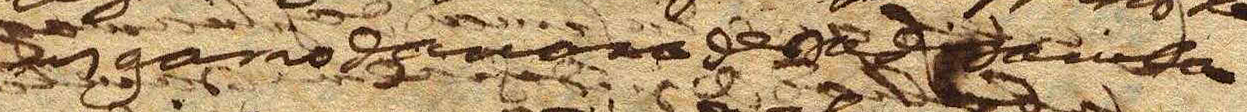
uigario da uara desta dita uila
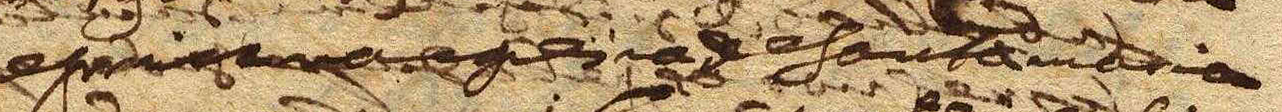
e prior na egreia de santa maria
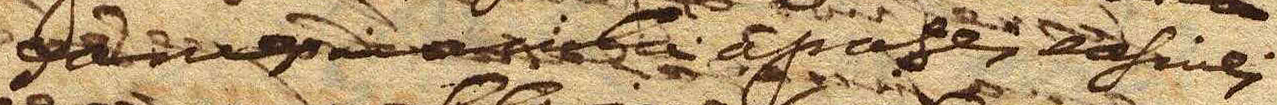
da mesma uila a pasei e asinej
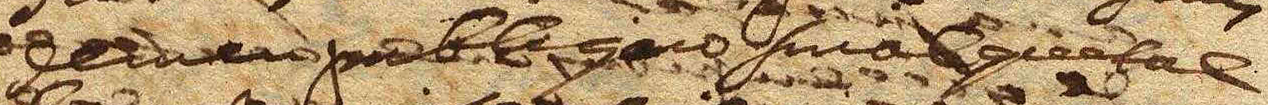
de meu publiquo sinal que tal
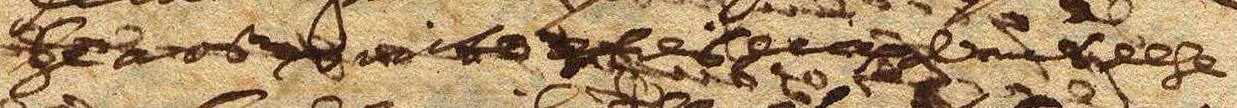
he aos vinte e tres dias do mes de se
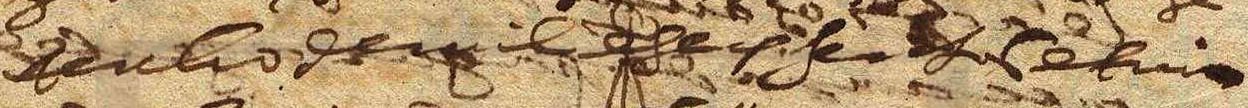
tenbro de mil e seissentos e trin
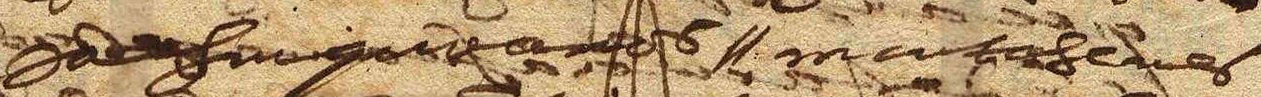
ta e simquo anos // montase nes
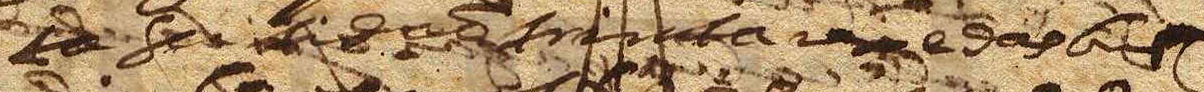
ta sertidaõ trinta reis e das bus
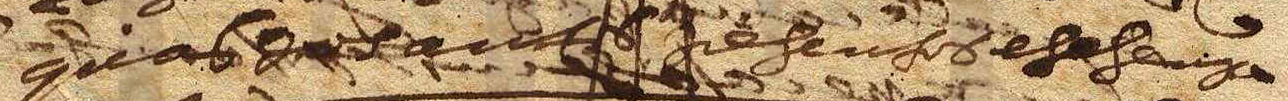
quas dos autos tresentos e sesemta
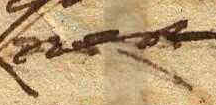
reis
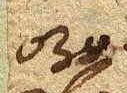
030
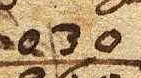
030
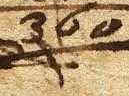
360
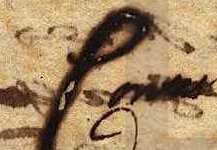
Conta
